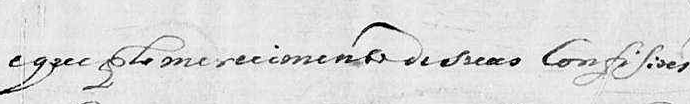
e que plo merecimento de suas confissoẽs
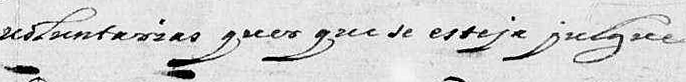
uoluntarias quer que se esteja julgue
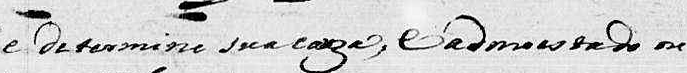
e determine sua cauza, e admoestado ou
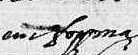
em forma
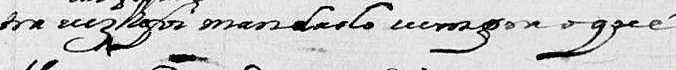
tra uez lhe foi mandado cumpra o que
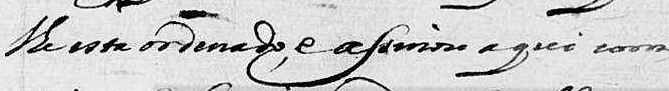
lhe esta ordenado, e assinou aqui com
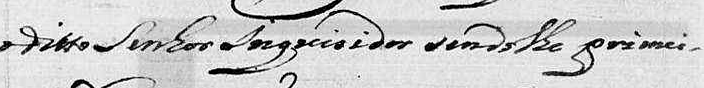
o ditto Senhor Inquisidor sendolhe primei
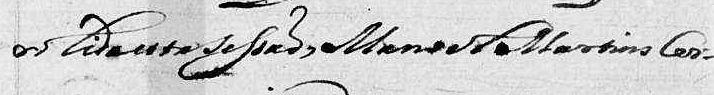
ro lida esta sessaõ, Manoel Martins Cer
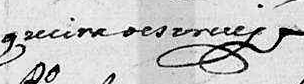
queira o escreuj
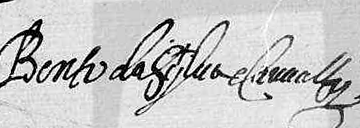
Bento da Sylua Carualho
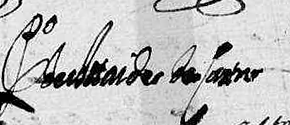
Po de Attaide_ de Castro
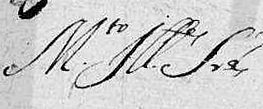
M.to Jll̄.es Srēs
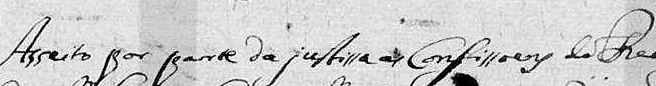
Asseito por parte da justissa as Confissoens do Reo
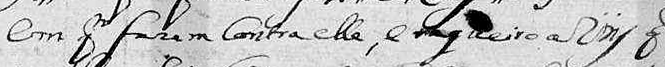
Em q̄ fazem Contra elle, e requeiro a V m̄s q̄
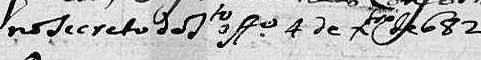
no secreto do sto off.o 4 de xbro de 682
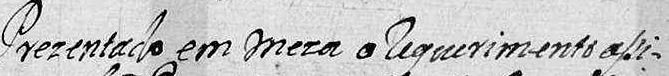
Prezentado em meza o Requerimento assi
